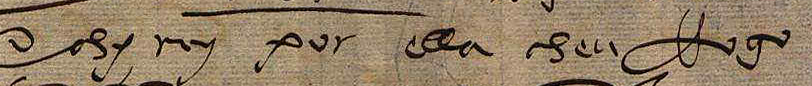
e asyney por ella a seu Rogo
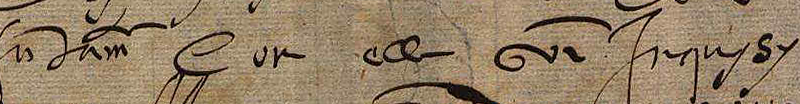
Jūtamte e ou elle sōr Jnquysy
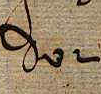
dor
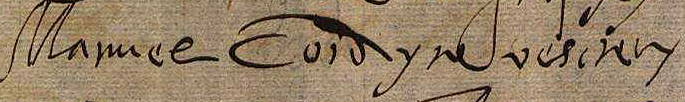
Manuel Cordeyro o escrevy
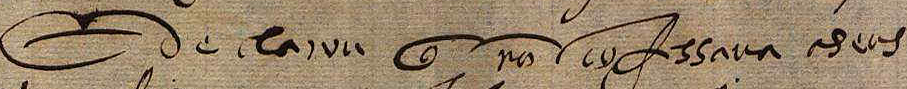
E declarou q̄ nā cōfessaua a seus
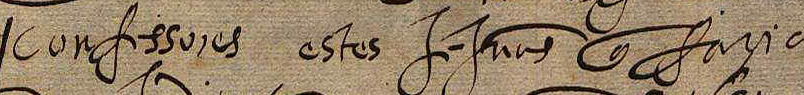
confessores estes JeJūus q̄ fazia
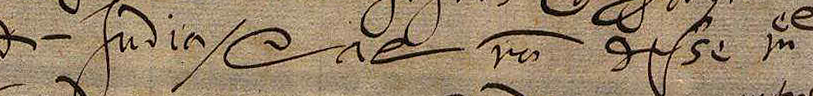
de Judia / e al n̄a disse mel
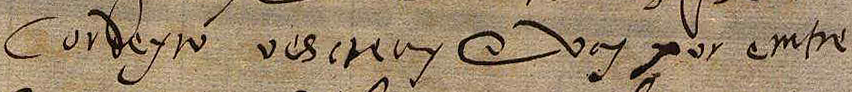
Cordeyro o escreuy e vaj por emtre
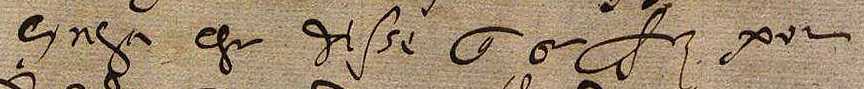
lynha lhe disse q̅ se fez por
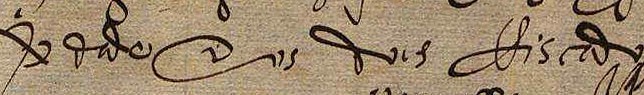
ꝟdade e os dous Riscado
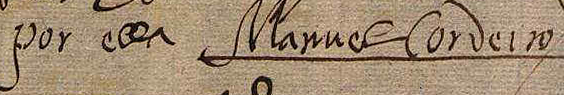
por ella Manuel Cordeiro
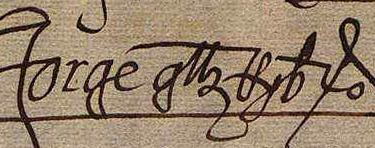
Jorge ḡllz Rybro
